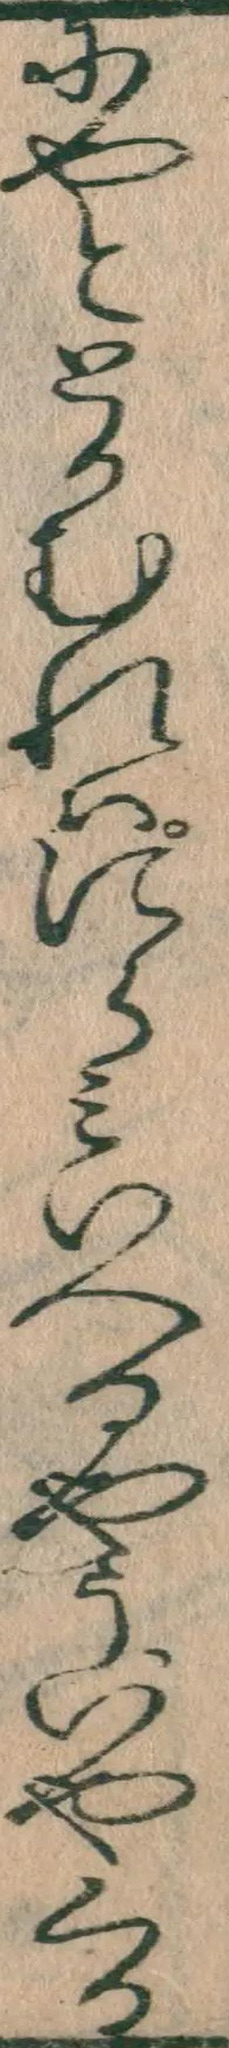にやととかむれは。にらみいへるやう。いやくる
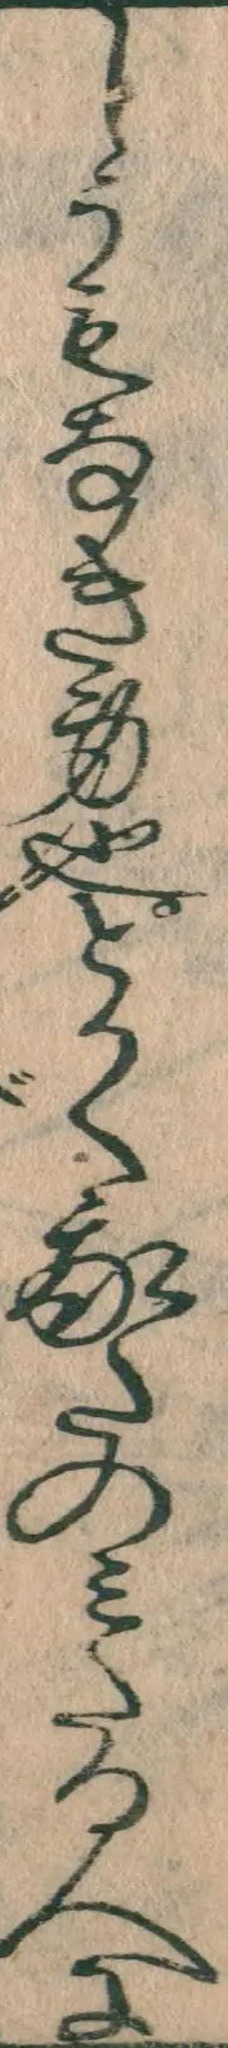しうもなき身也。とかく我たのみたる人に
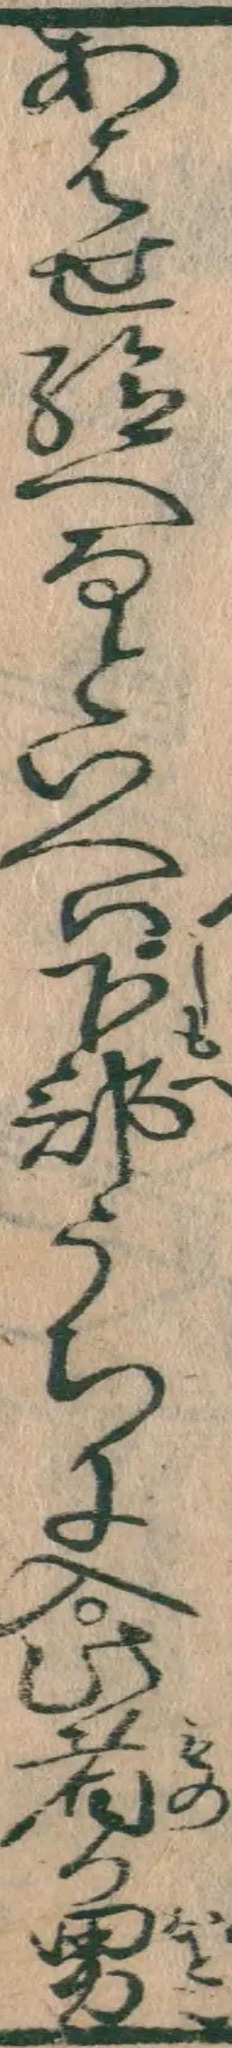あはせ給へなといへは、下部うちに入。此者か男
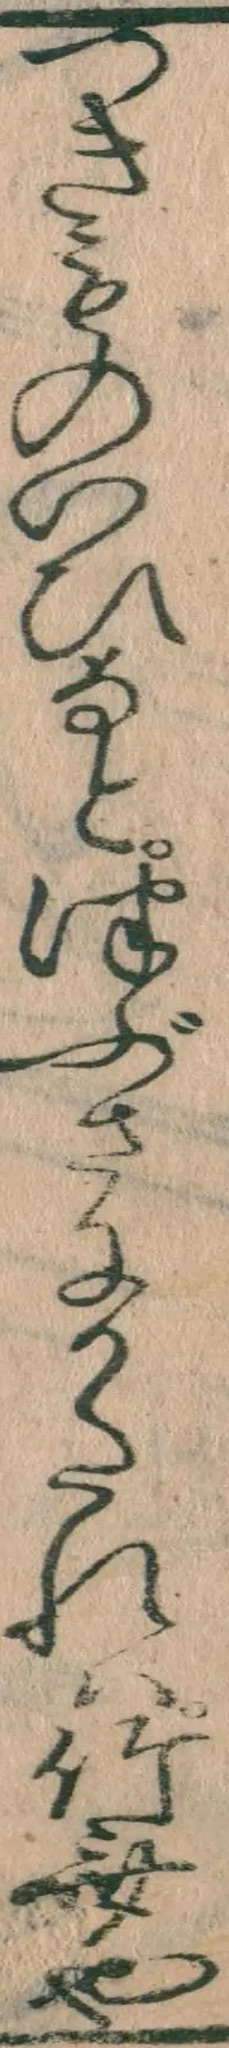つきものいひなと。つぶさにかたれは。竹斎や
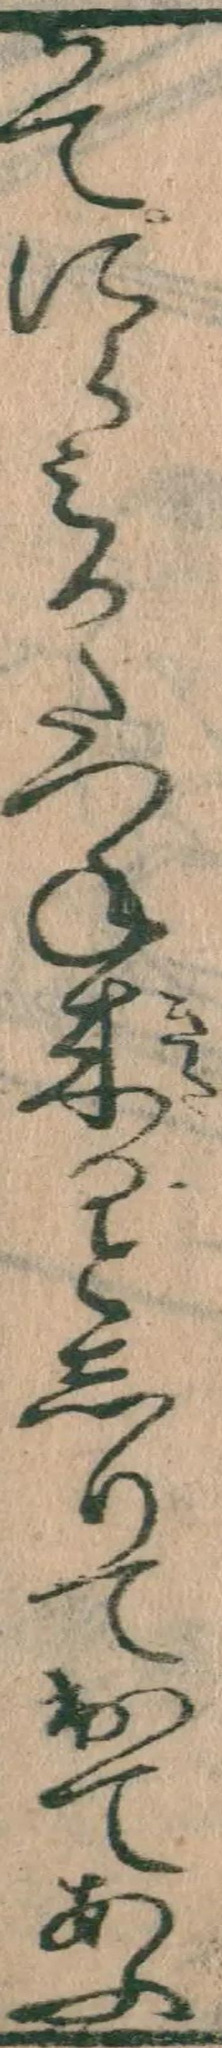かてにらみかたつね来るとしりて出てあふ
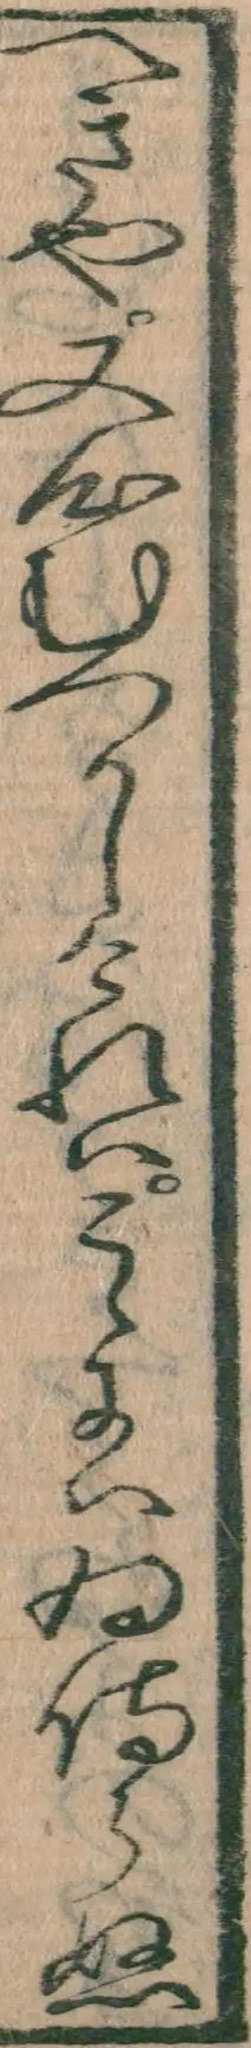へきや。又心むつかしけれは。こゝにはゐ侍らぬ
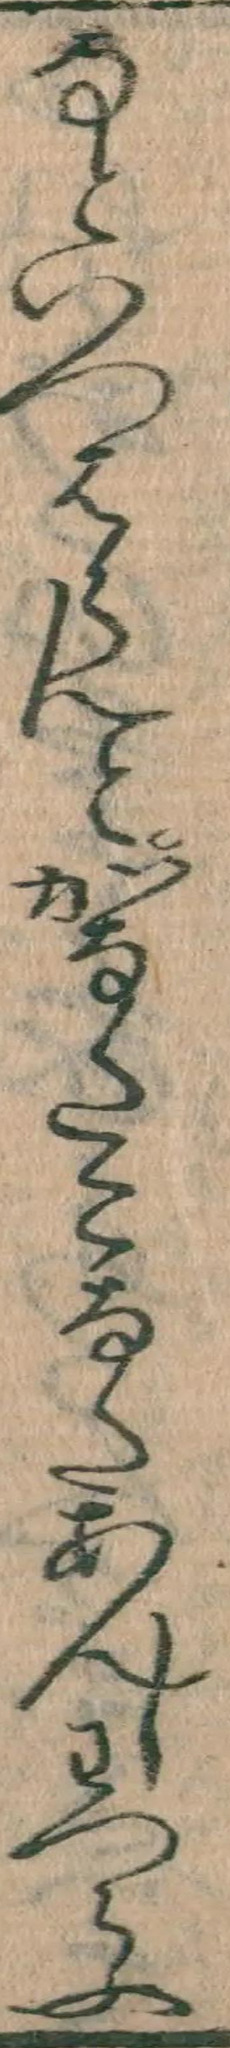なといつはらんと。かなたこなたあんしわつらふ
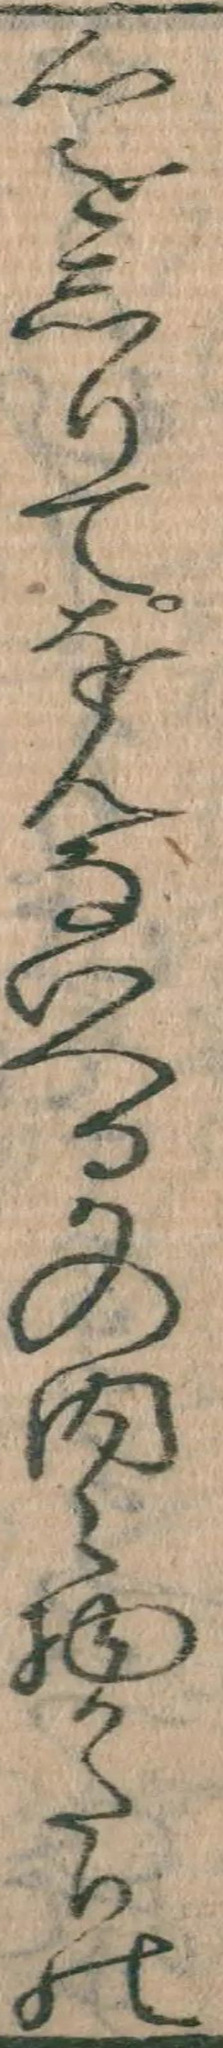心をしりて。をんないへるかの内々物かたりの
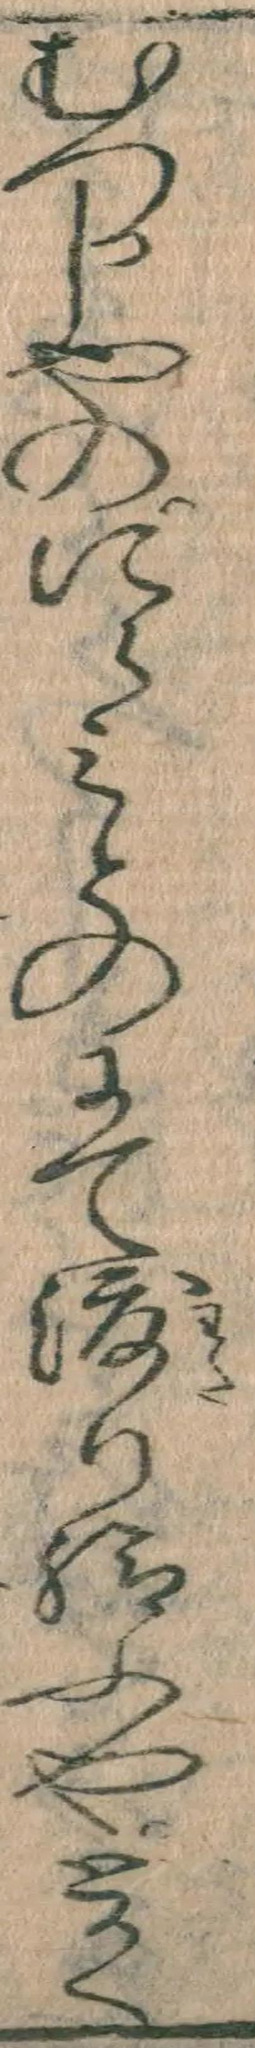むつかしやの。にらみとのにて渡り給ふや。とかく
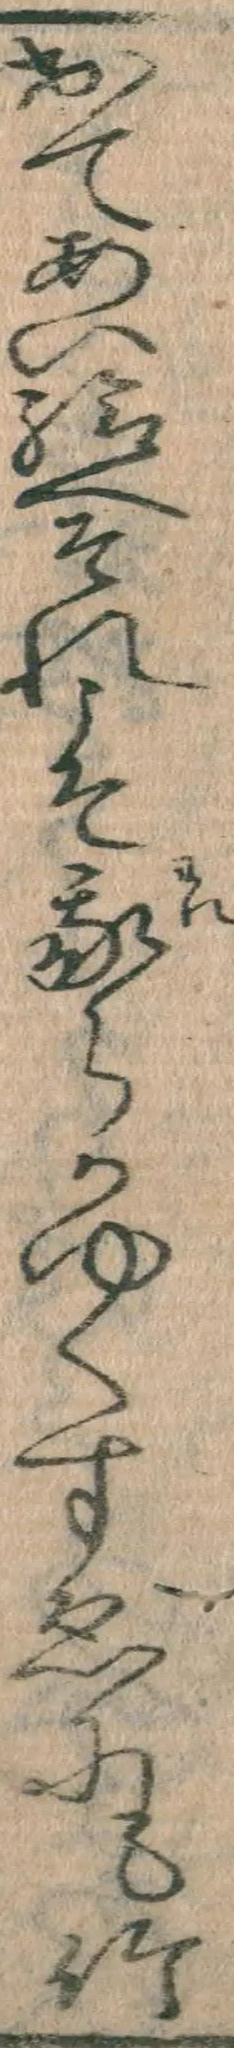出てあい給へそれこそ我らかゆくすゑにも竹
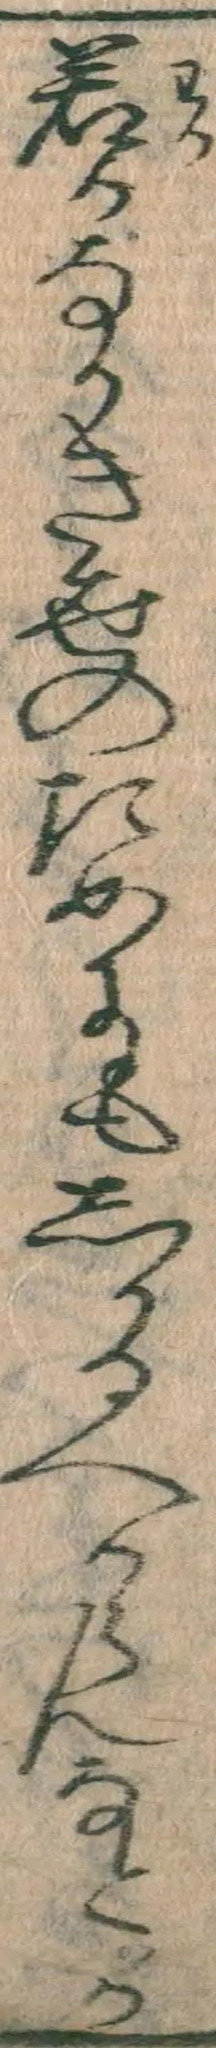若かなかき世のためにもしかるへからんなと。か
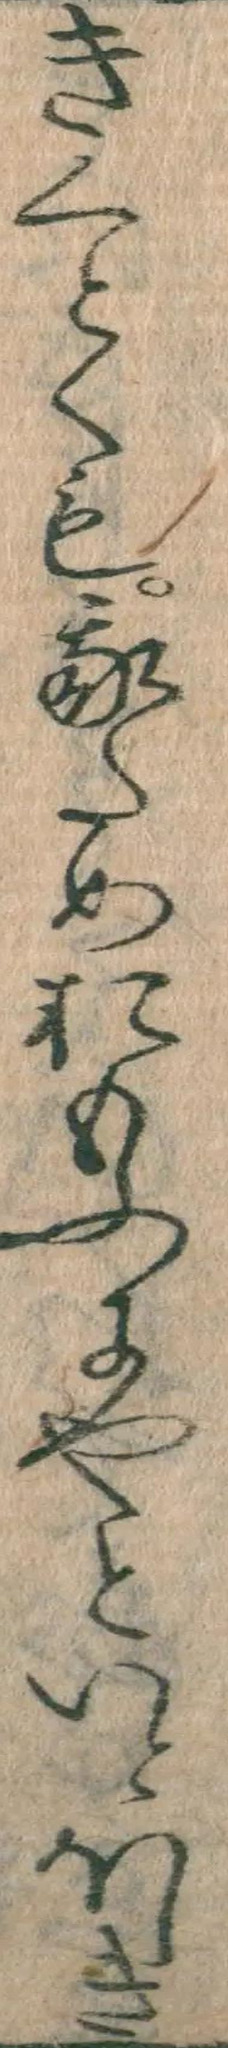きくとくも。我ためおもふにやといとほしき
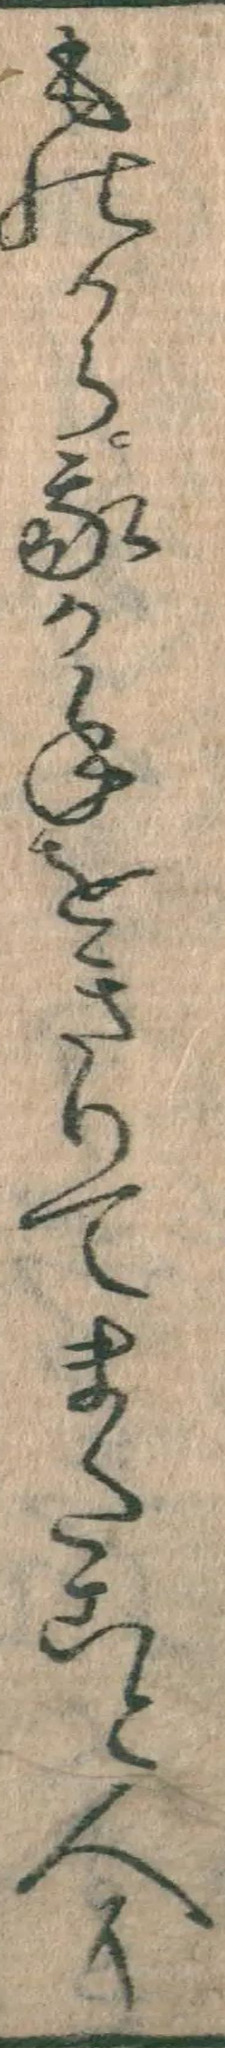ものから。我か手をきりてまたこと人に
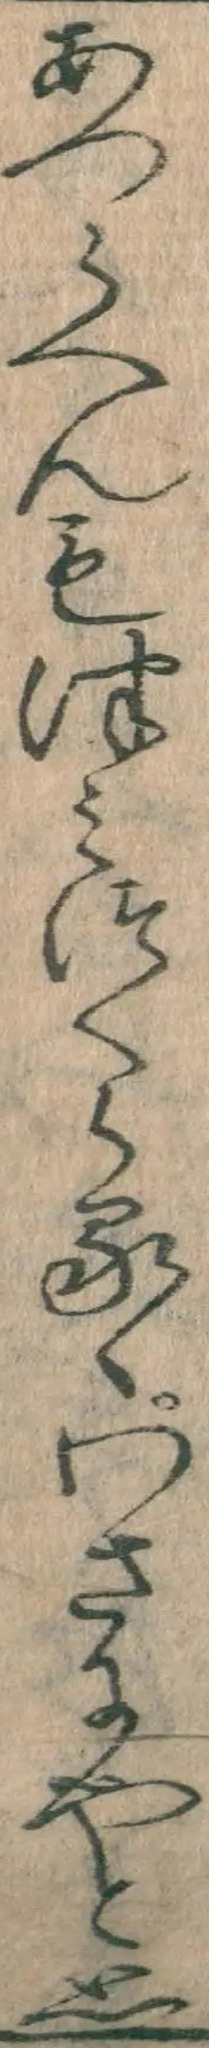あつらへんもつみつくらるゝ。わさにやと思
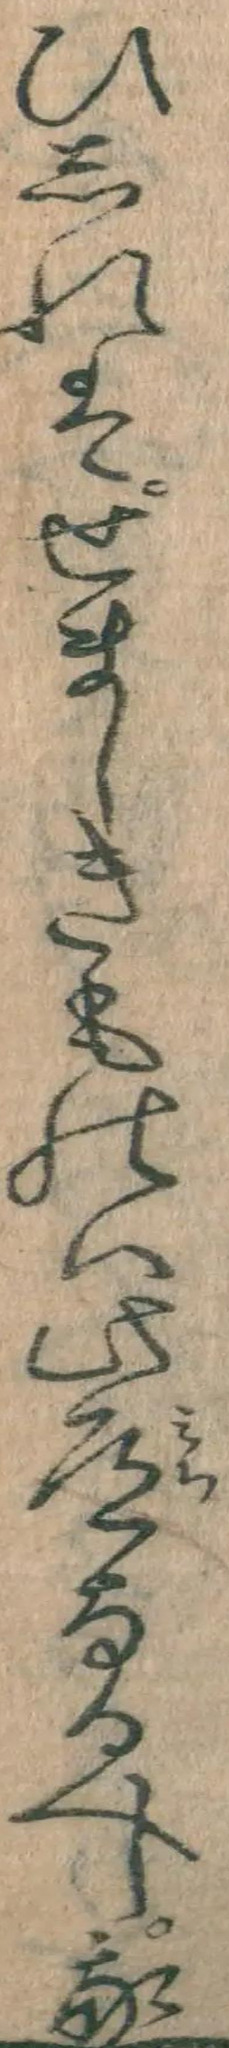ひしれは。せましきものは此道なるへし。我

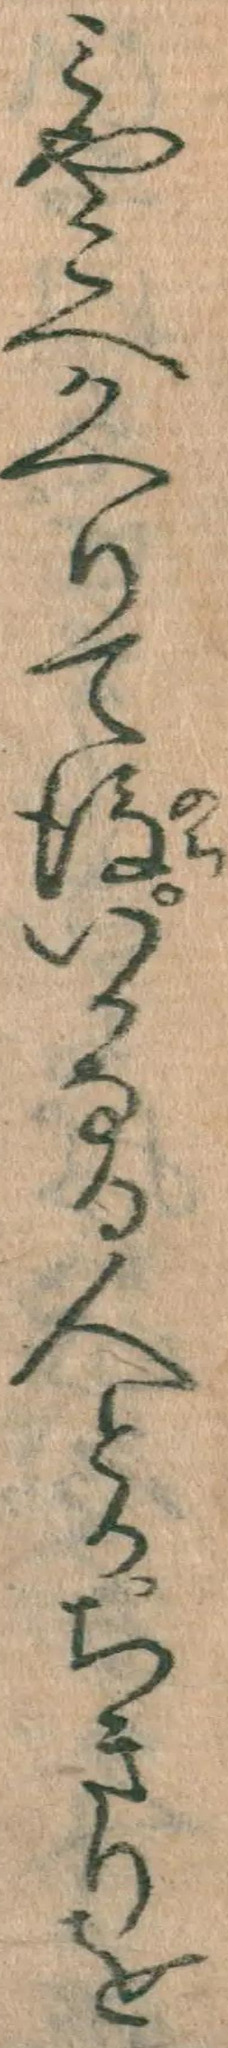みやこへかへりて後。いかなる人とか。ちきりを
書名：竹斎狂歌物語 3巻
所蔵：国立国会図書館 National Diet Library, JAPAN
